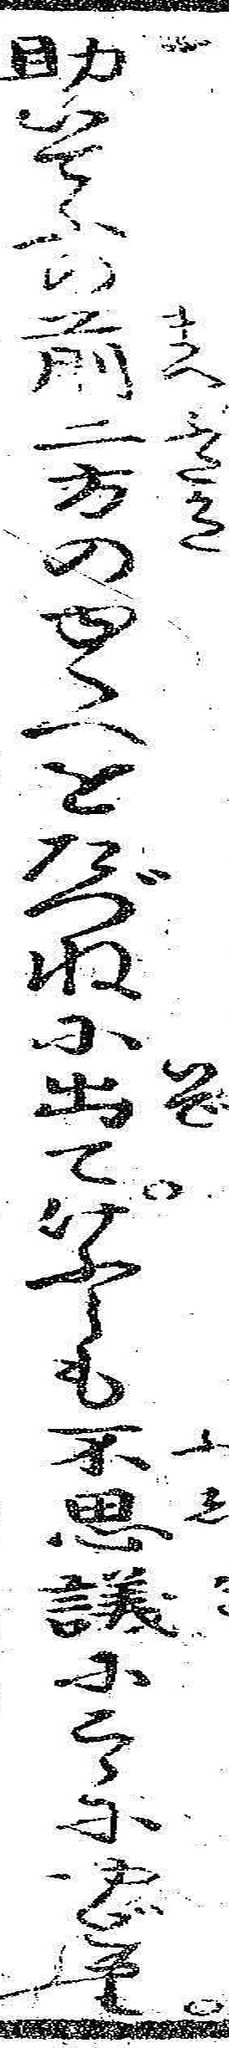助いてふの前二方のゆくへをたづねに出て。けふしも不思議にこゝにやどり。
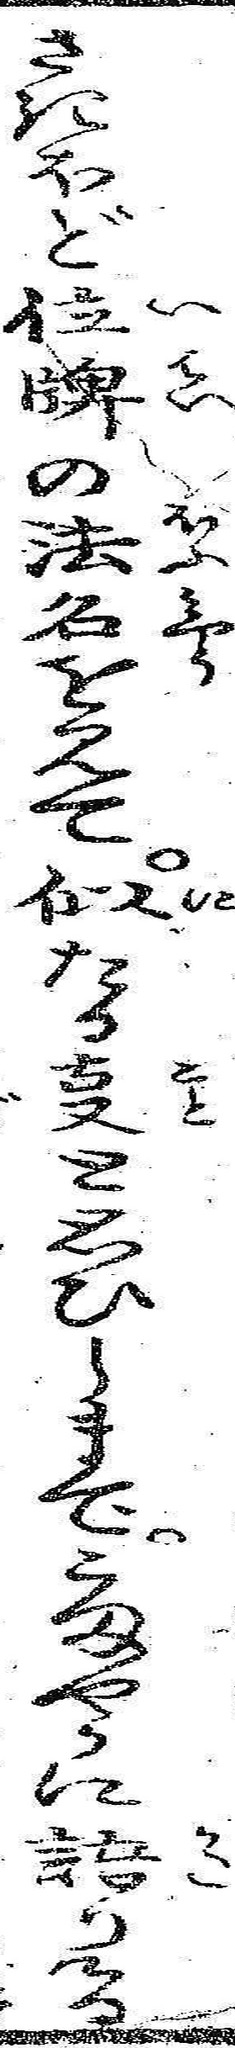さきほど位牌の法名を見て。似たる事と思ひしまで。こまやかに語りける
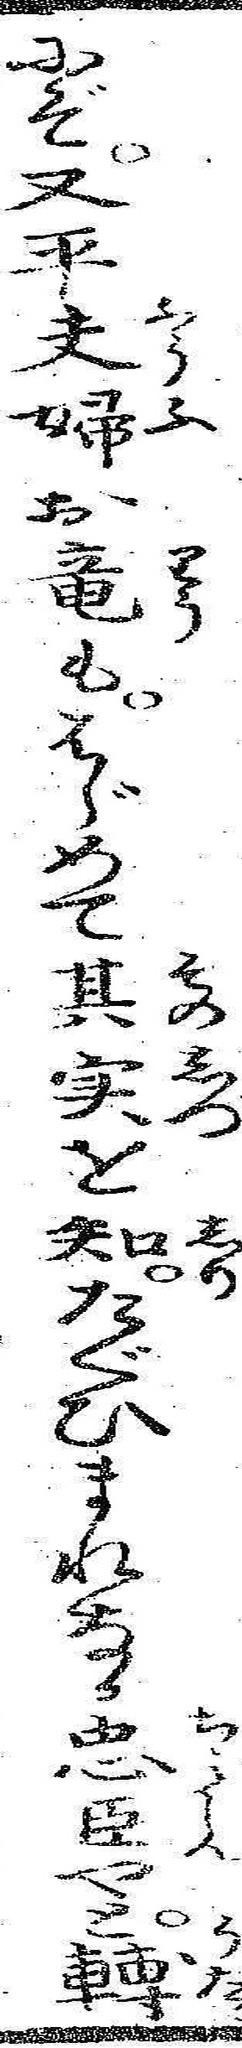にぞ。又平夫婦お竜も。はじめて其実を知。たぐひまれなる忠臣やと。転
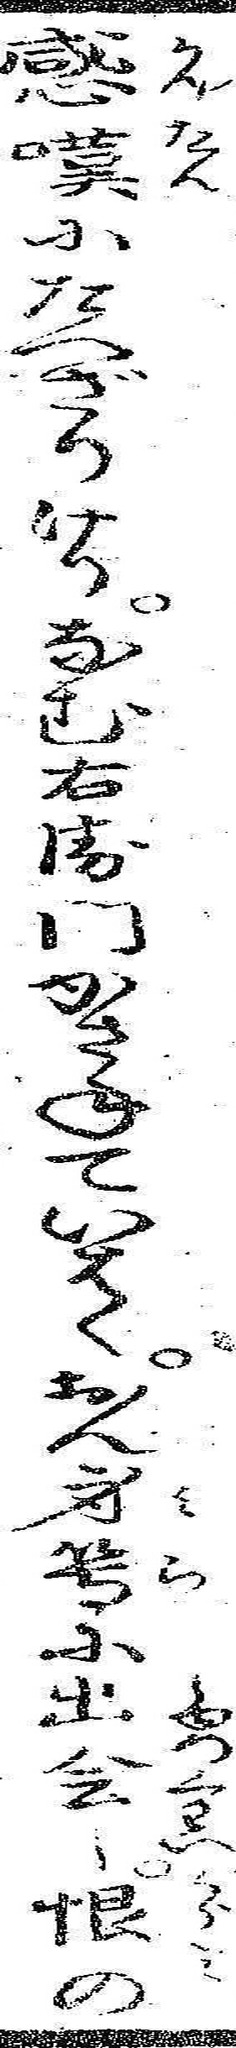感嘆にたへざりけり。なむ右衛門かさねていはく。おん身等に出会し。恨の
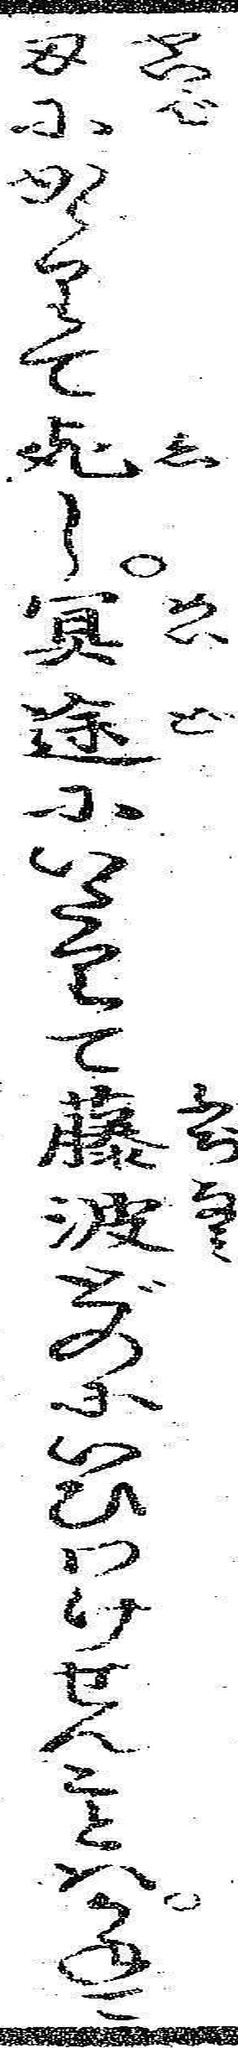刃にかゝりて死し。冥途にいたりて藤波どのにいひわけせんことは。かねて
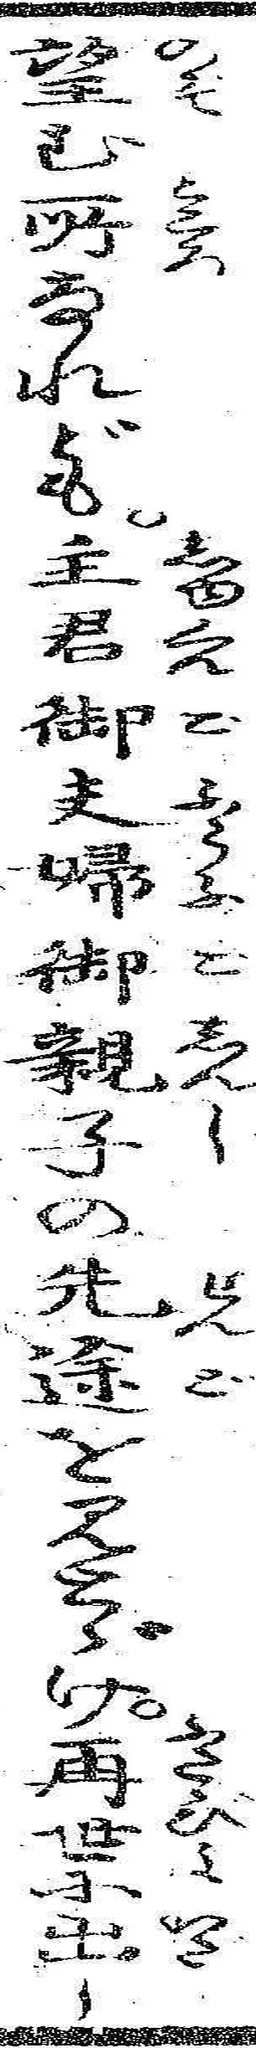望む所なれども。主君御夫婦御親子の先途を見とゞけ。再世に出し
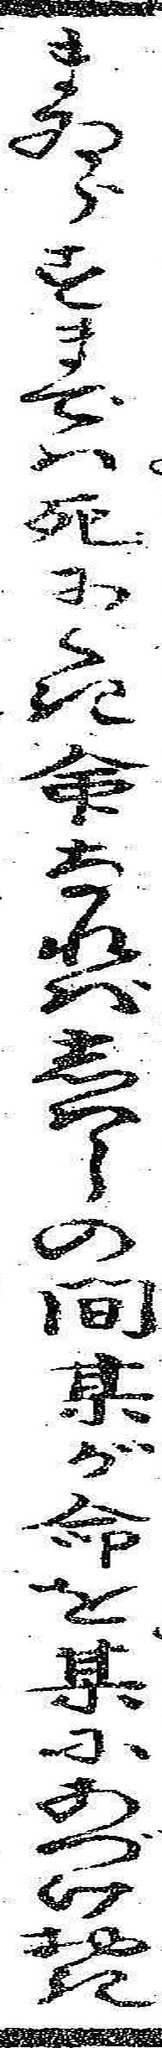まゐらすまでは。死にくき命なれば。しはしの間某が命を。某にあづけおき
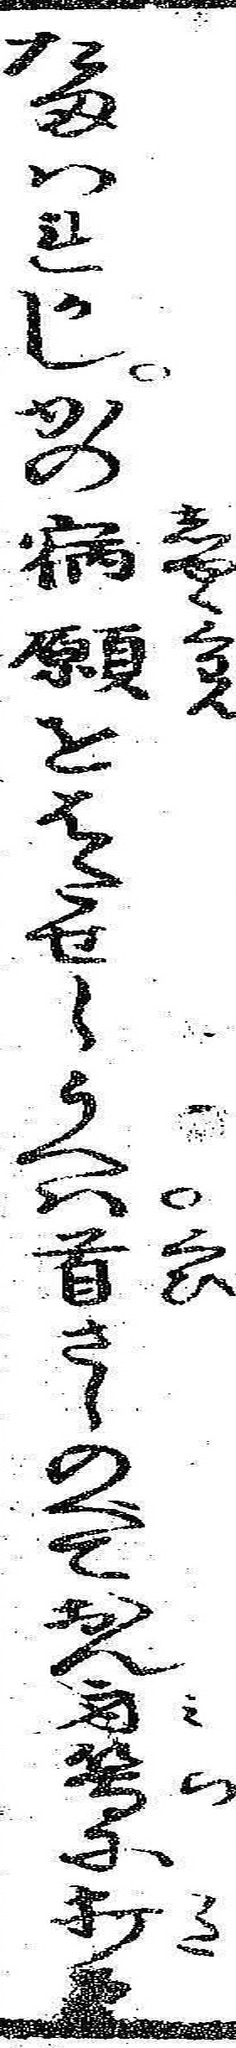たまはれかし。かの宿願をはたせしうへは。首さしのべておん身等に打る
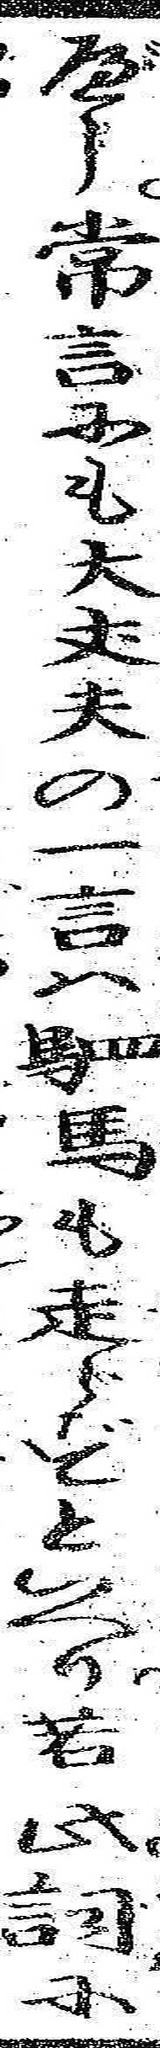べし。常言にも大丈夫の一言は。駟馬も走らずといへり。若此詞に
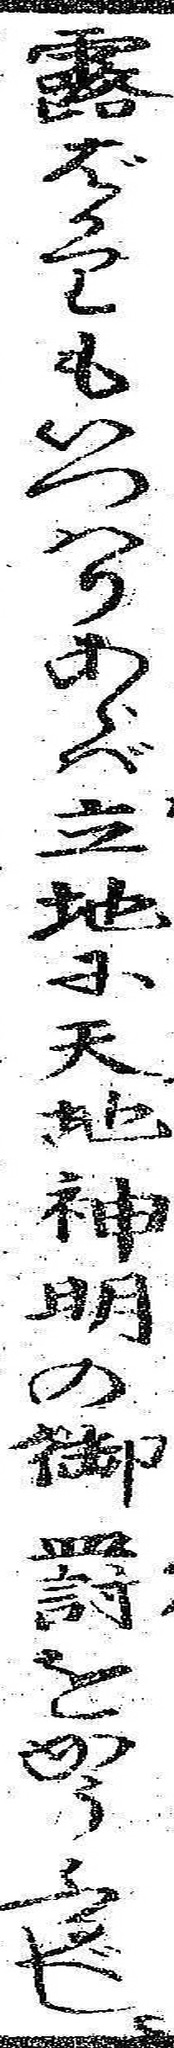露ばかりもいつはりあらば。立地に天地神明の御罰をかうふるべし。
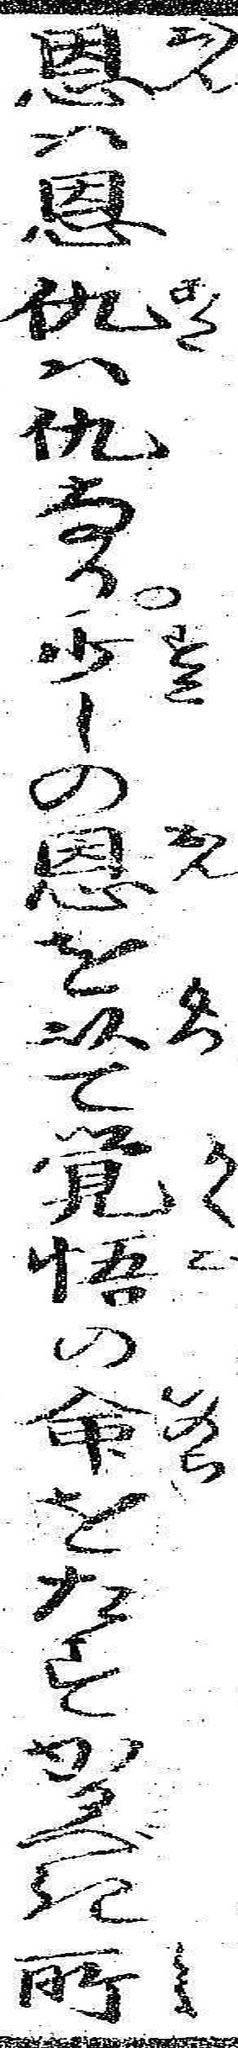恩は恩仇は仇なり。少しの恩を以て覚悟の命をたすかるべき所
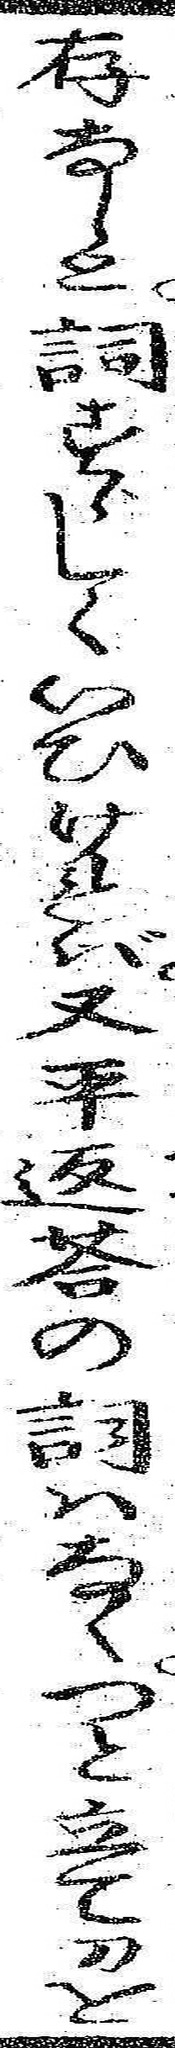存なしと。詞すゞしくいひければ。又平返答の詞はなく。つと立て刀を
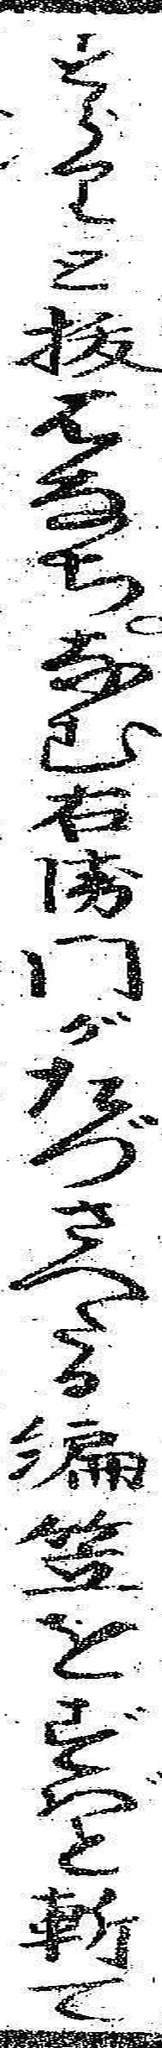すらりと抜はなち。なむ右衛門がたづさへたる編笠をずばと斬て。
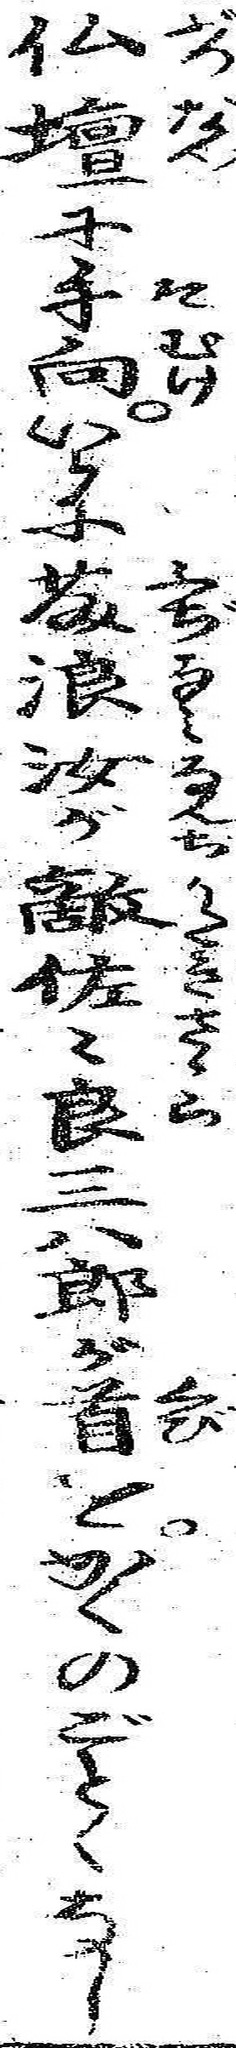仏壇に手向。いかに藤浪汝が敵佐々良三八郎が首を。かくのごとくなし
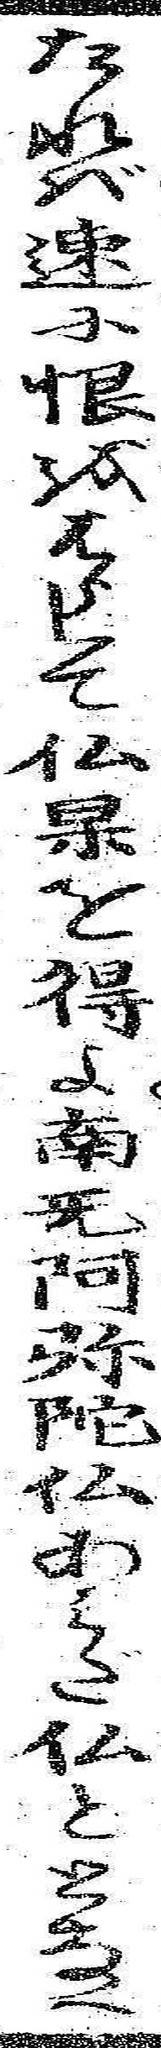たれば。速に恨をはらして仏果を得よ。南無阿弥陀仏あみだ仏ととなへ。
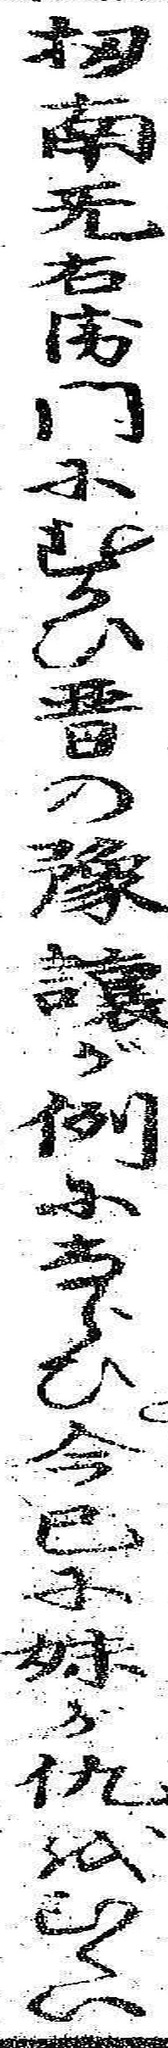扨南無右衛門にむかひ。晋の予譲が例にならひ。今已に妹が仇をむくい
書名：昔話稲妻表紙
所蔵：国文学研究資料館
